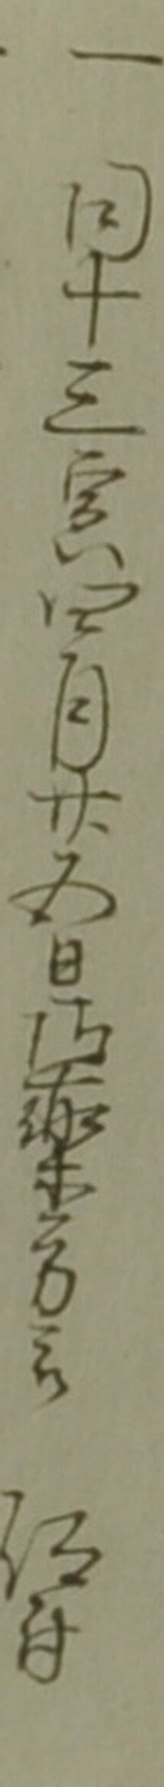一同十三寅四月廿五日御薬方被仰付
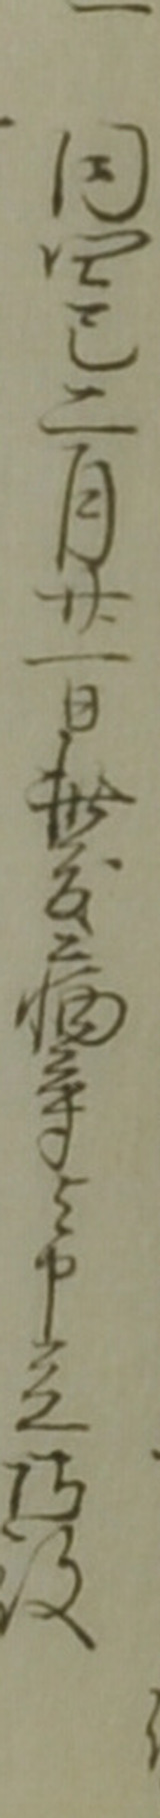一同四己二月廿一日此度病気与申立御役
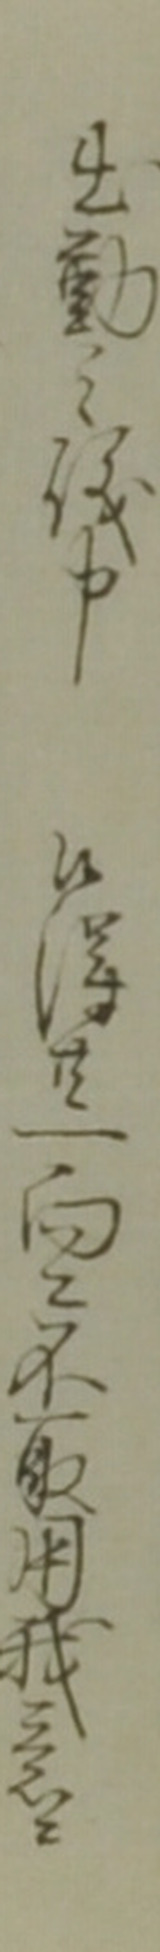出勤之儀申候得共一向ニ不取用我意ニ
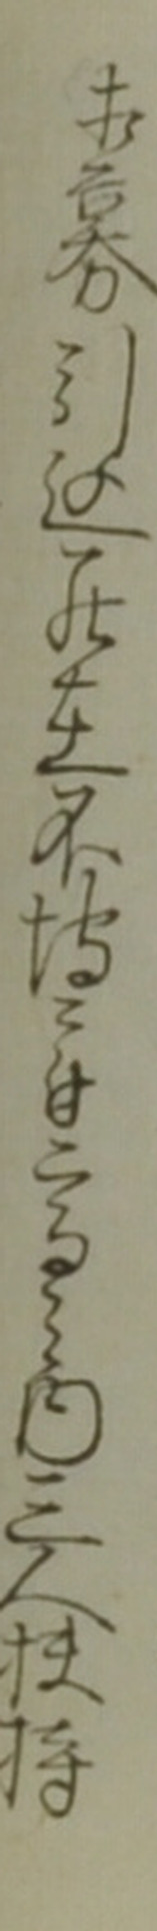相募引込罷在不埒ニ付高之内三人扶持
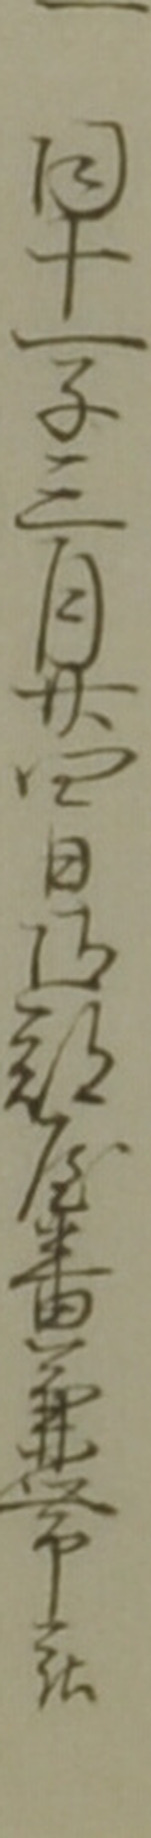一同十一子三月廿四日御部屋番兼帯被
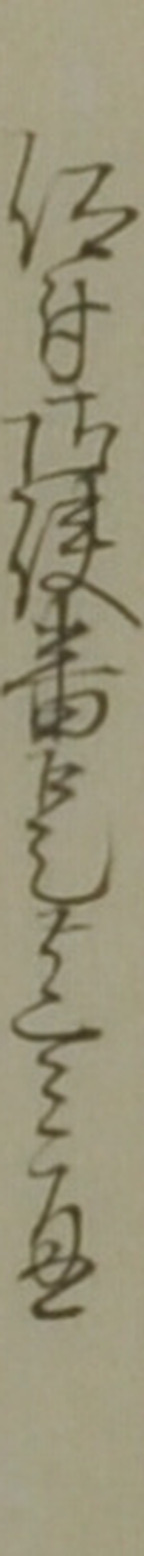仰付御使番是迄之通
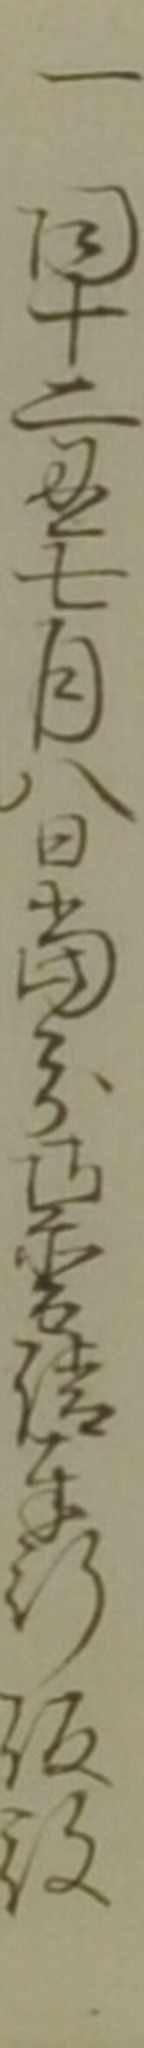一同十二丑七月八日当分御普請奉行仮役

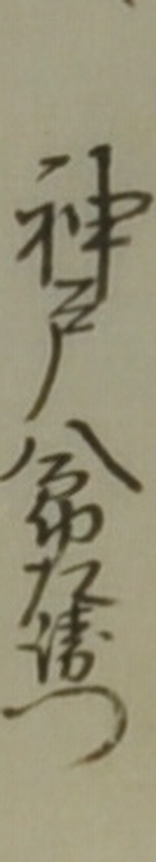神戸五郎右衛門
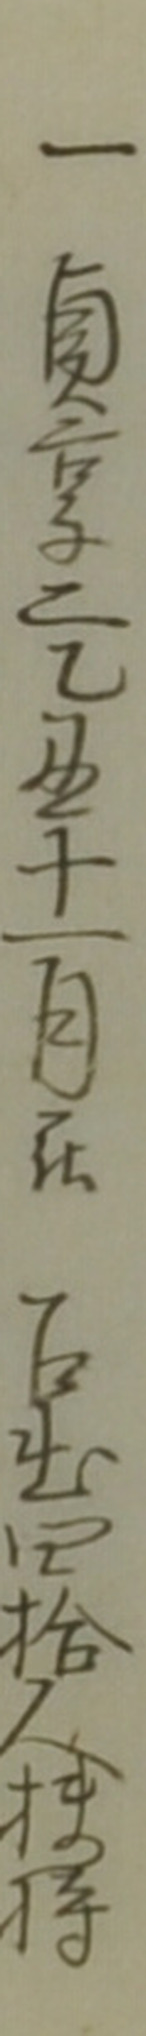一貞享二乙丑十一月被召出四拾人扶持
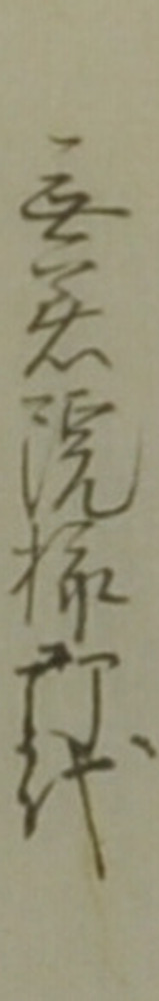無着院様御代
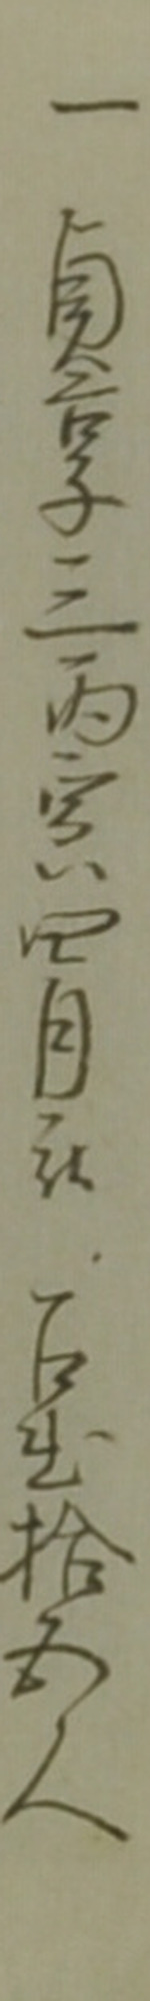一貞享三丙寅四月被召出拾五人
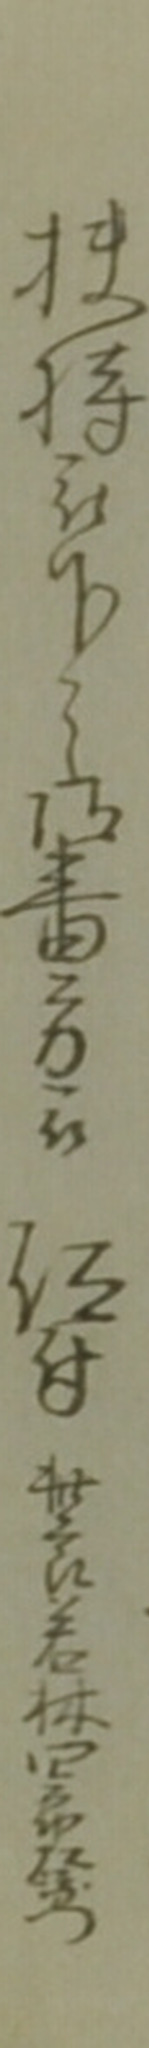扶持被下之御番方被仰付此節若林四郎左衛門
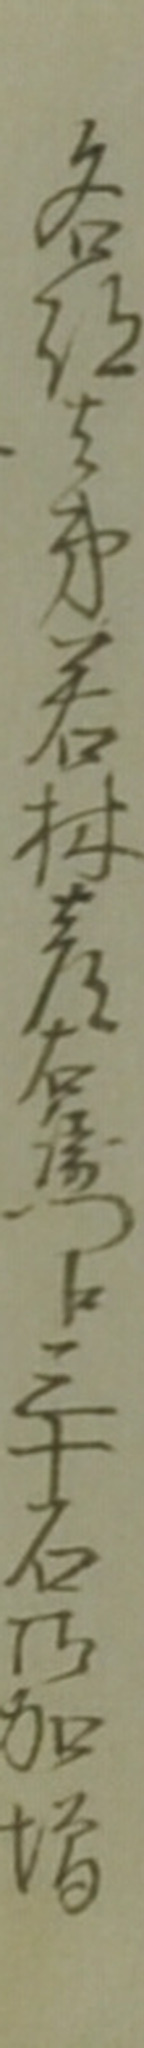名跡は弟若林彦右衛門江三十石御加増
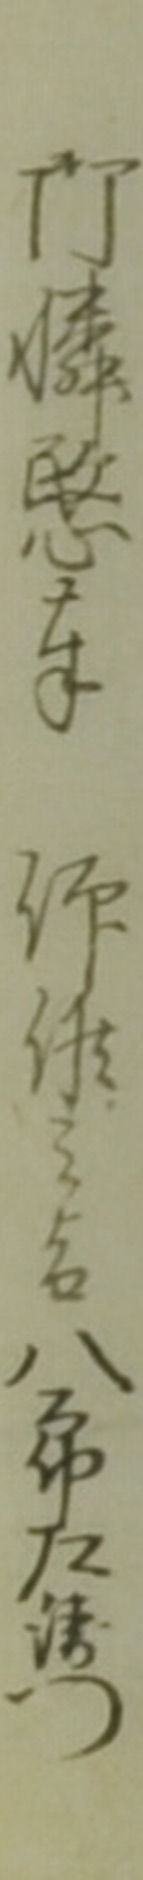御憐愍奉仰候之旨八郎左衛門

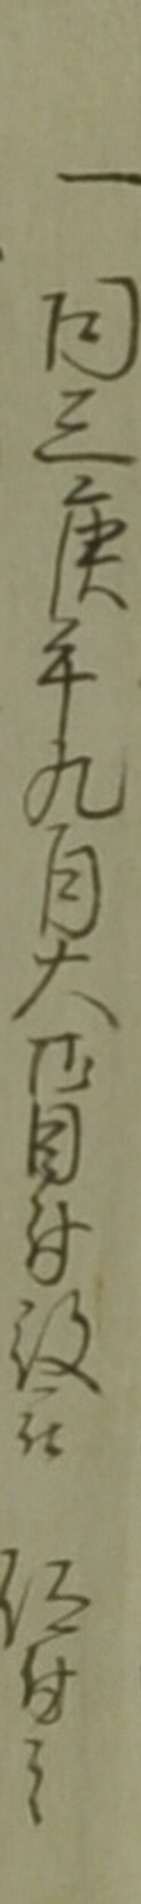一同三庚午九月大御目付役被仰付候
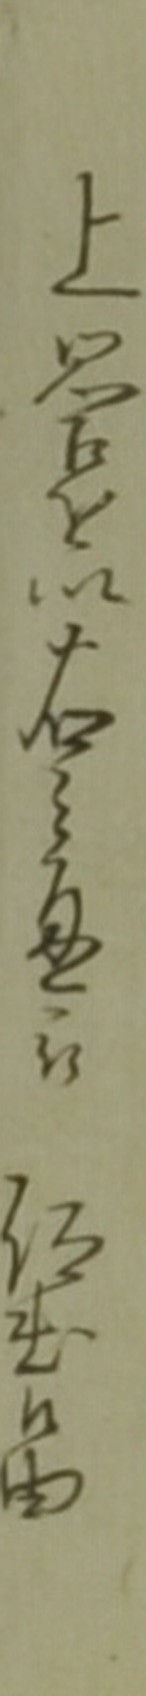上思召を以右之通ひ被仰出候由
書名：給人諸士勤仕録（三）
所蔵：伊那市立高遠町図書館・合同会社AMANE
